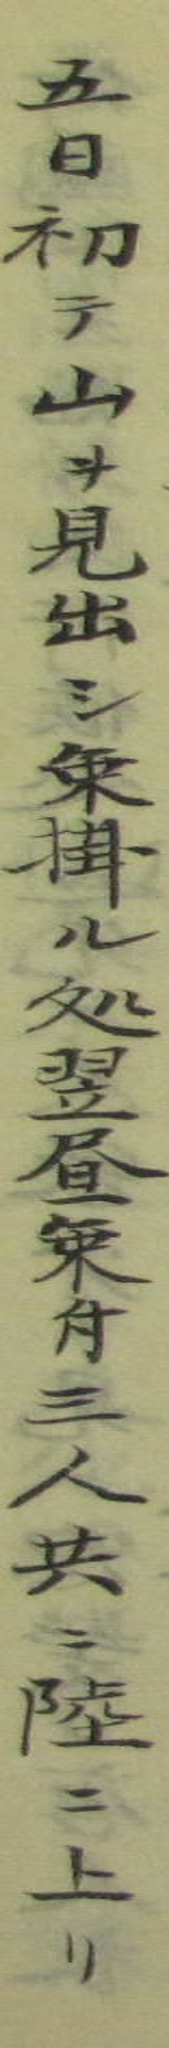五日初テ山ヲ見出シ乗掛ル処翌昼乗付三人共ニ陸ニ上リ

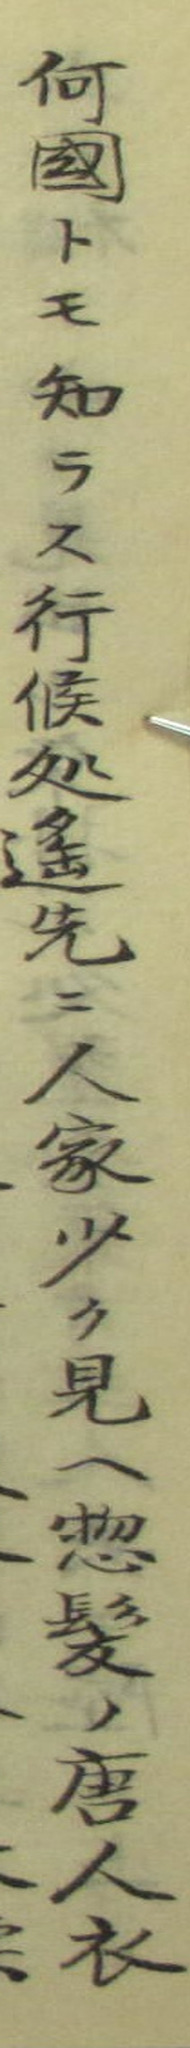何國トモ知ラス行候処遥先ニ人家少ク見ヘ惣髪ノ唐人衣
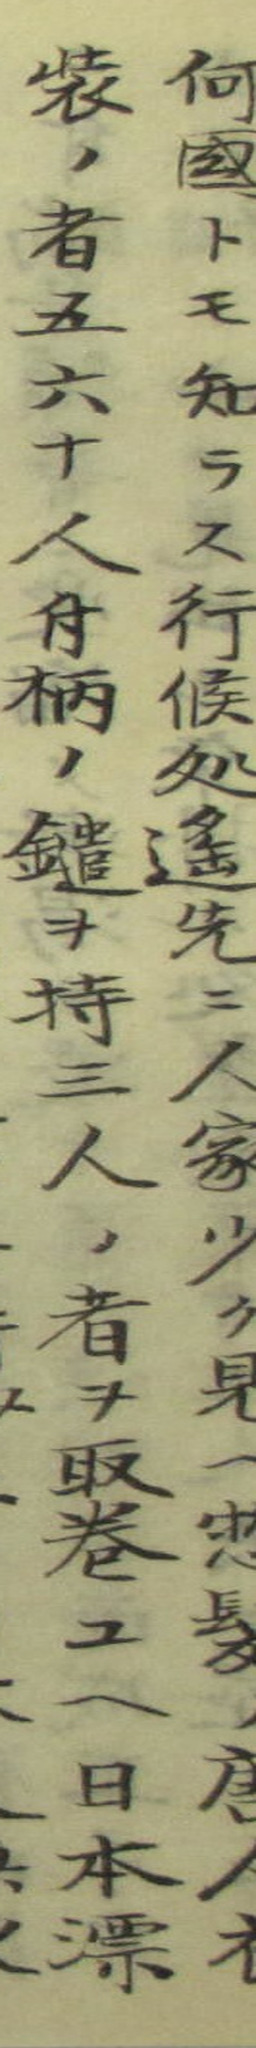装ノ者五六十人付柄ノ鑓ヲ持三人ノ者ヲ取巻ユヘ日本漂
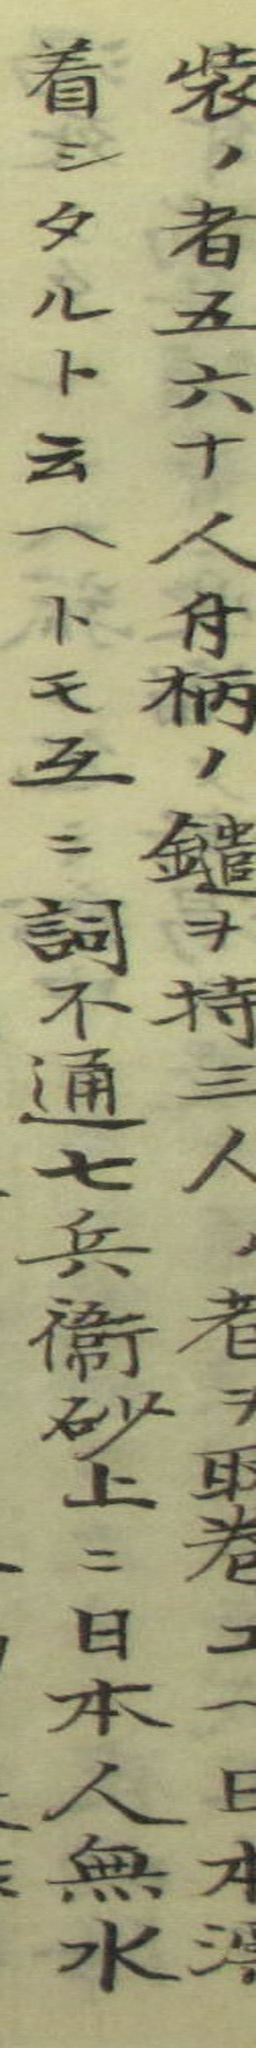着シタルト云ヘトモ互ニ詞不通七兵衛砂上ニ日本人無水
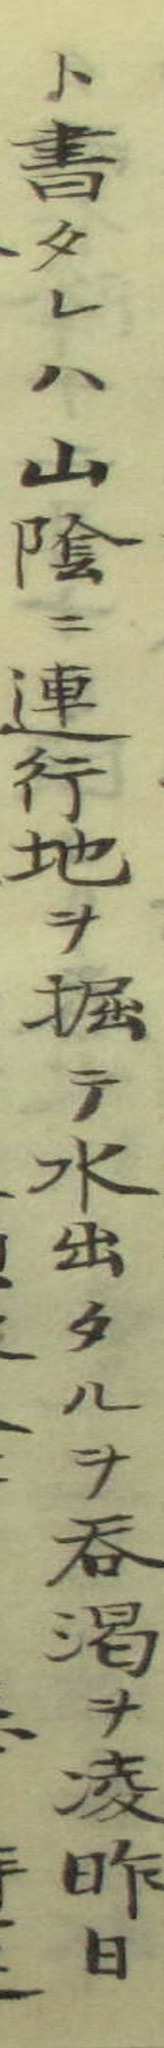ト書タレハ山陰ニ連行地ヲ掘テ水出タルヲ呑渇ヲ凌昨日
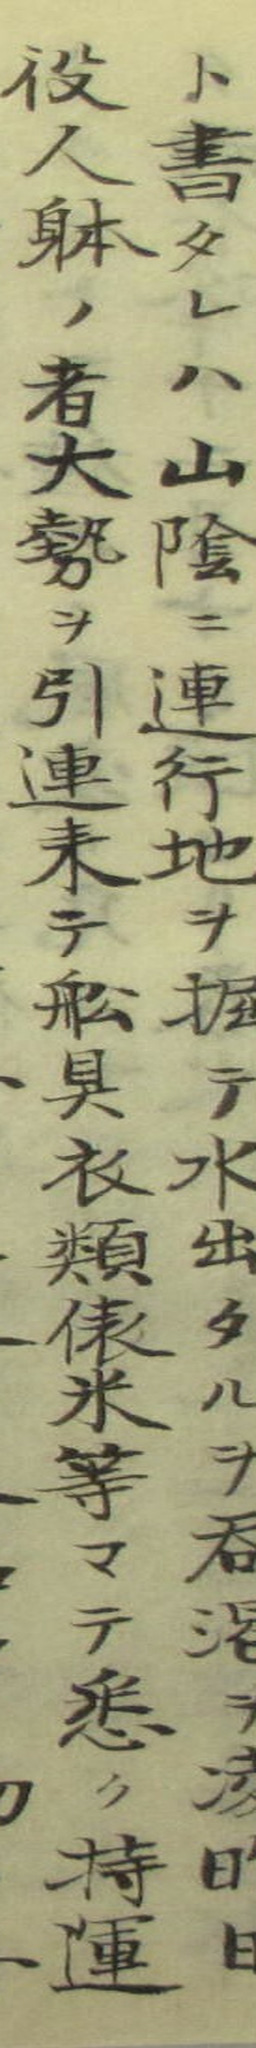役人躰ノ者大勢ヲ引連来テ舩具衣類俵米等マテ悉ク持運
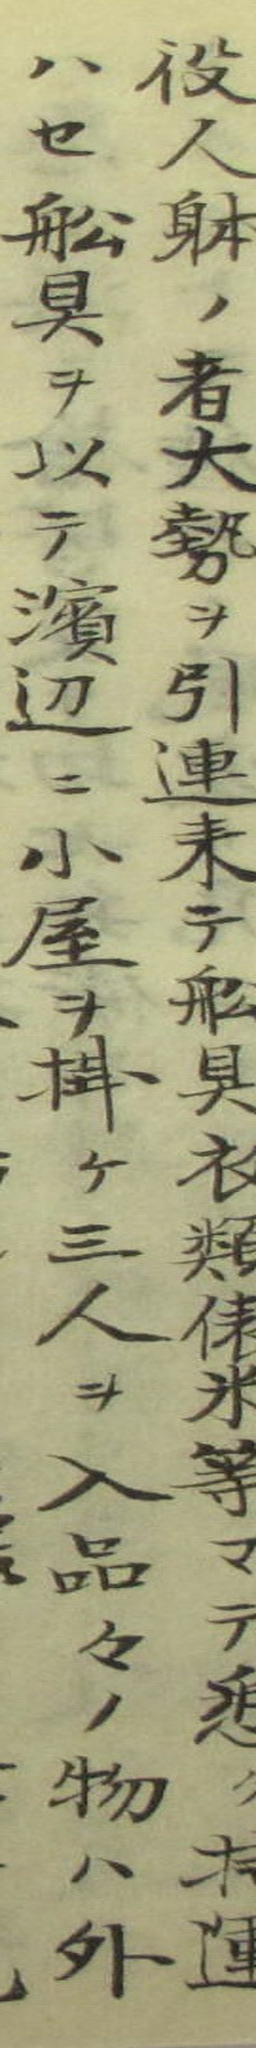ハセ舩具ヲ以テ濱辺ニ小屋ヲ掛ケ三人ヲ入品々ノ物ハ外
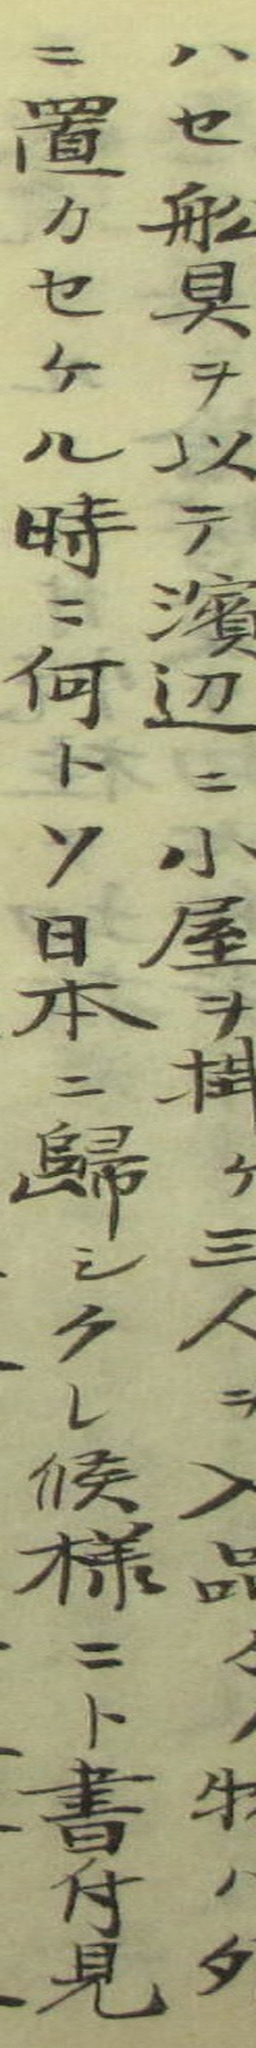ニ置カセケル時ニ何トソ日本ニ歸シクレ候様ニト書付見
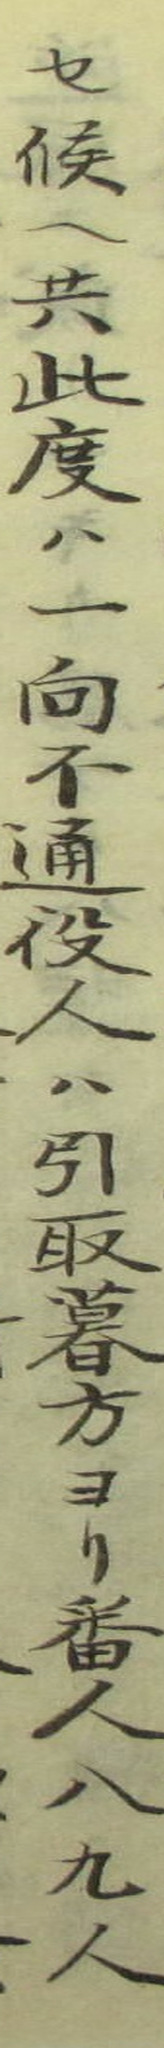セ候ヘ共此度ハ一向不通役人ハ引取暮方ヨリ番人八九人
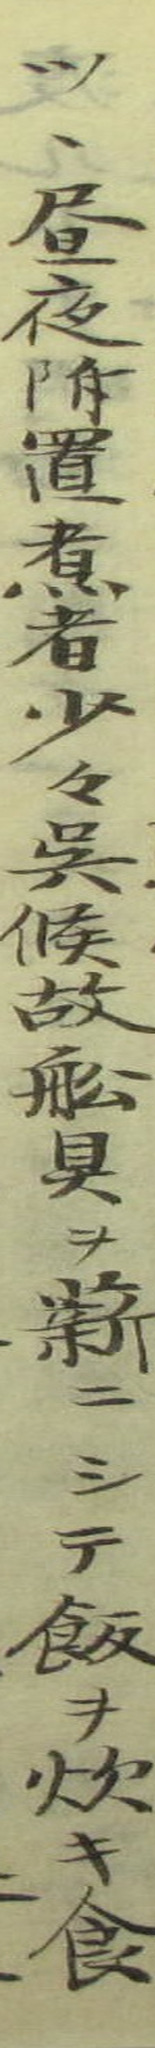ツヽ昼夜附置煮者少々呉候故舩具ヲ薪ニシテ飯ヲ炊キ食
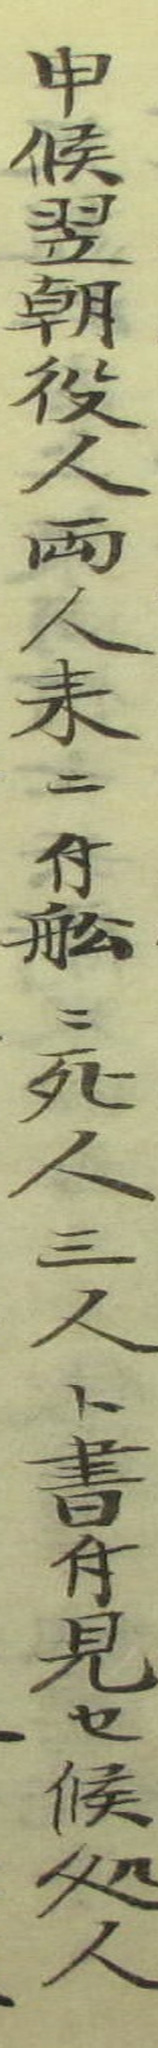申候翌朝役人両人来ニ付舩ニ死人三人ト書付見セ候処人
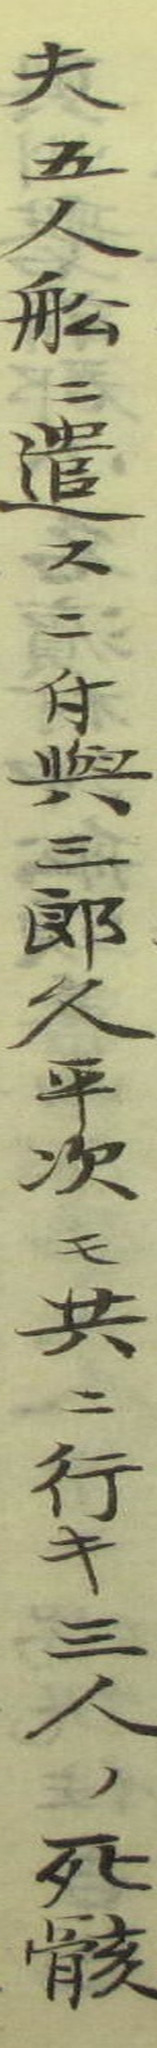夫五人舩ニ遣スニ付與三郎久平次モ共ニ行キ三人ノ死骸
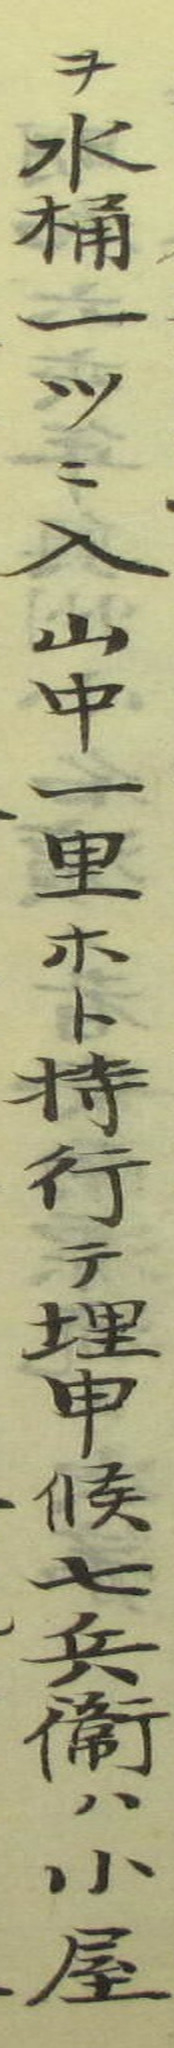ヲ水桶一ツ二入山中一里ホト持行テ埋申候七兵衛ハ小屋
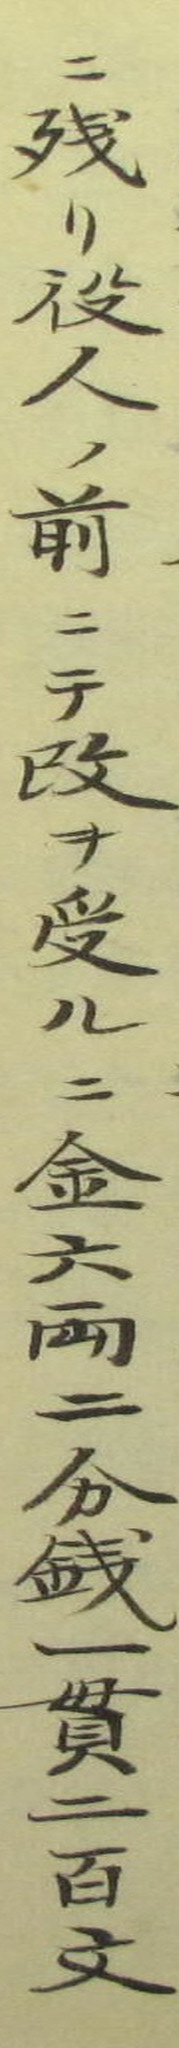ニ残リ役人ノ前ニテ改ヲ受ルニ金六両二分銭一貫二百文
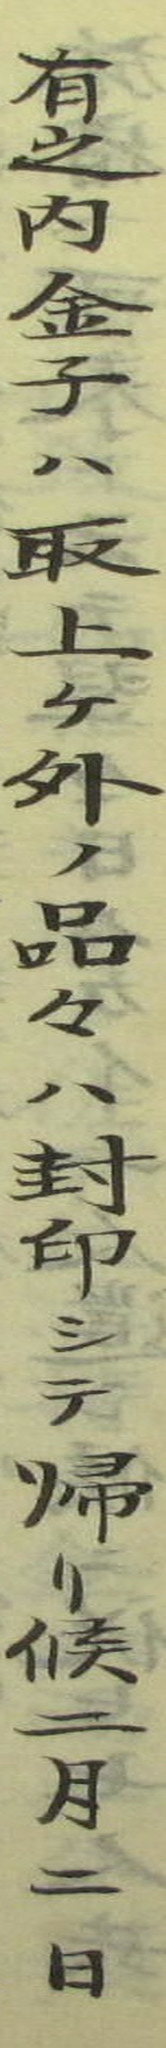有之内金子ハ取上ケ外ノ品々ハ封印シテ帰リ候二月二日
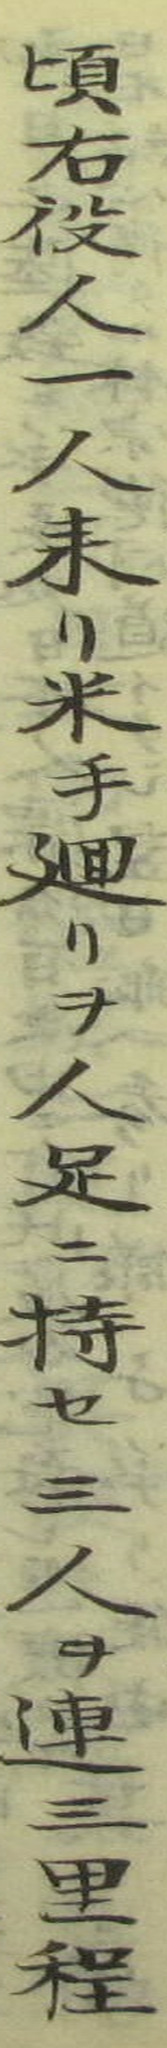頃右役人一人来リ米手廻リヲ人足ニ持セ三人ヲ連三里程
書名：異国船漂着記 外二
